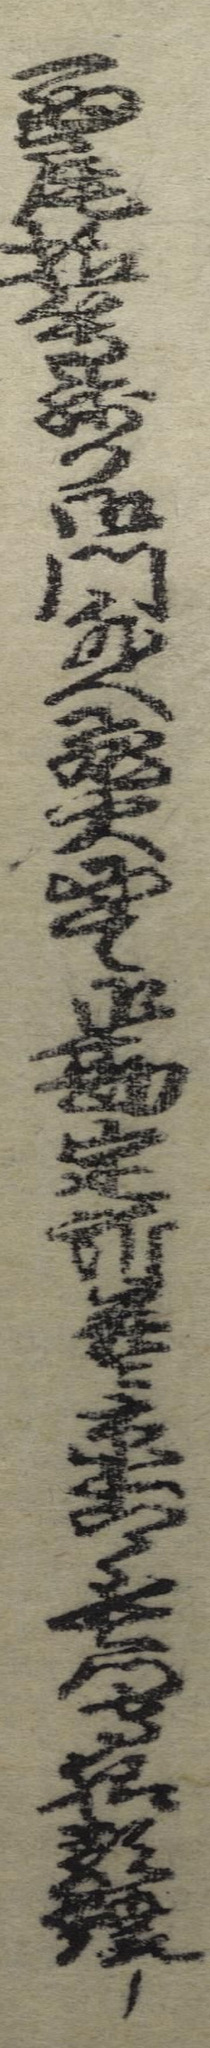西尾様等残り御門外へ飛火にて御勘定所并に京こく長門守様類焼し
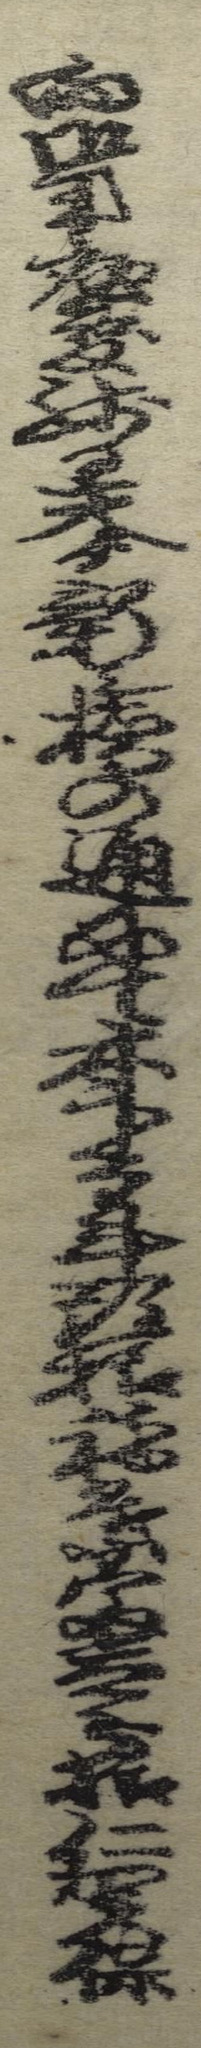向御用屋敷残る夫ゟ新橋の通にて木下主計頭様稲葉富太郎様仁賀保
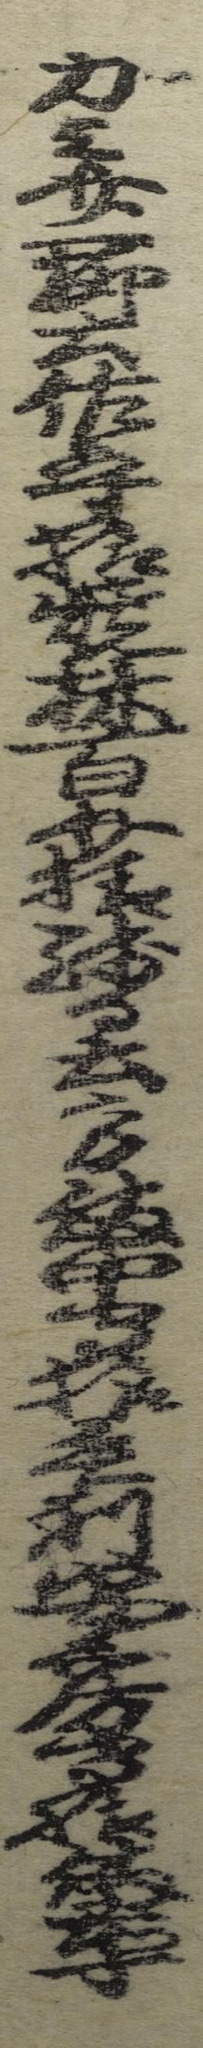力之介一柳土佐守様焼林百介様残る土方備中守様毛利安房守様備前丁
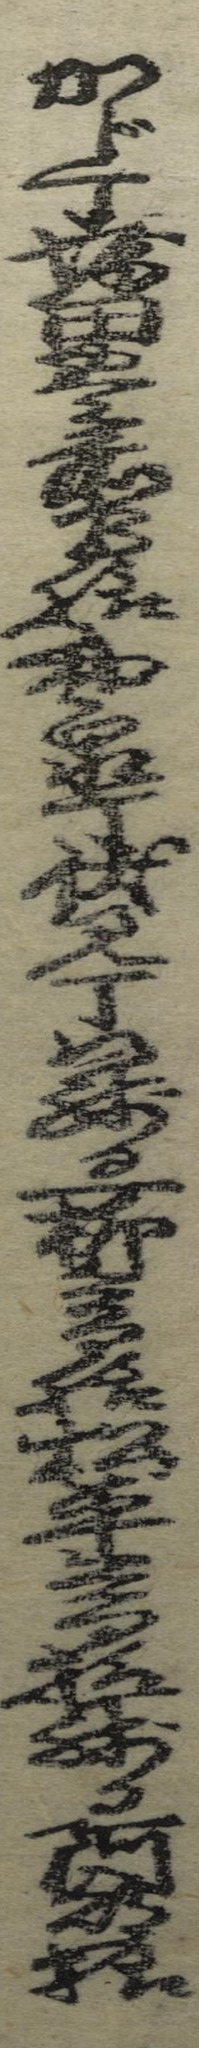かじ丁堀田豊前守様和泉丁伏見丁は残る一柳兵部様松平兵部様残る阿部様
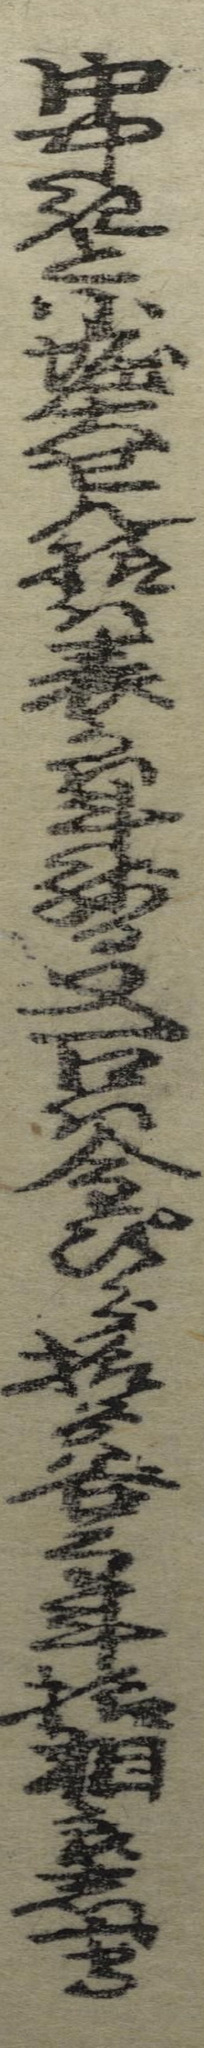中やしきと小堀大ぜん様は表かは斗残る又一口は金ぴら様ゟ谷主計様相良志摩守
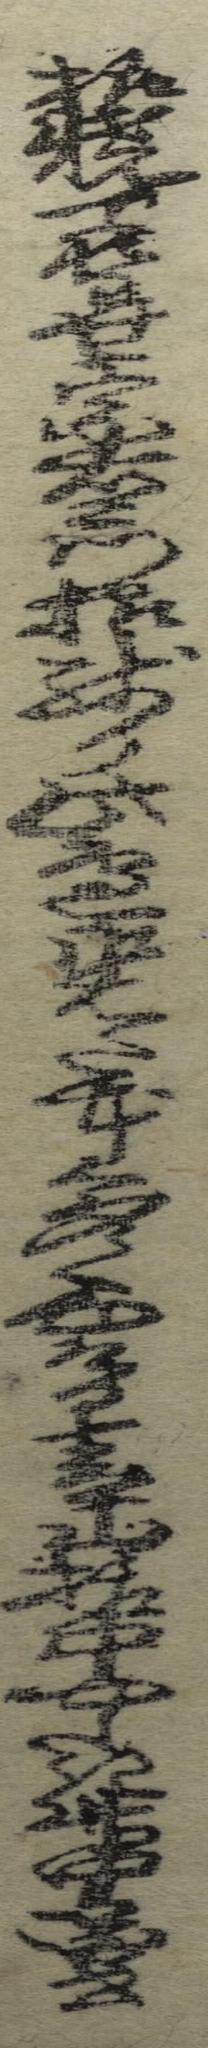様焼き野原せ宗右衛門様残り此辺御はた本多くやける青山様中やしき竹中図書
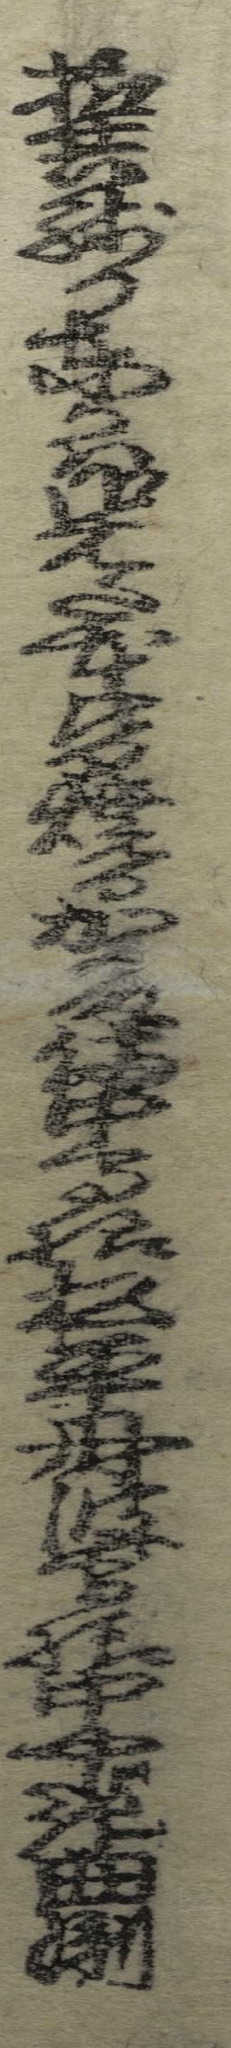様共残り東かは御はた本皆焼る加藤備中守様松平丹波守様中やしき曲渕
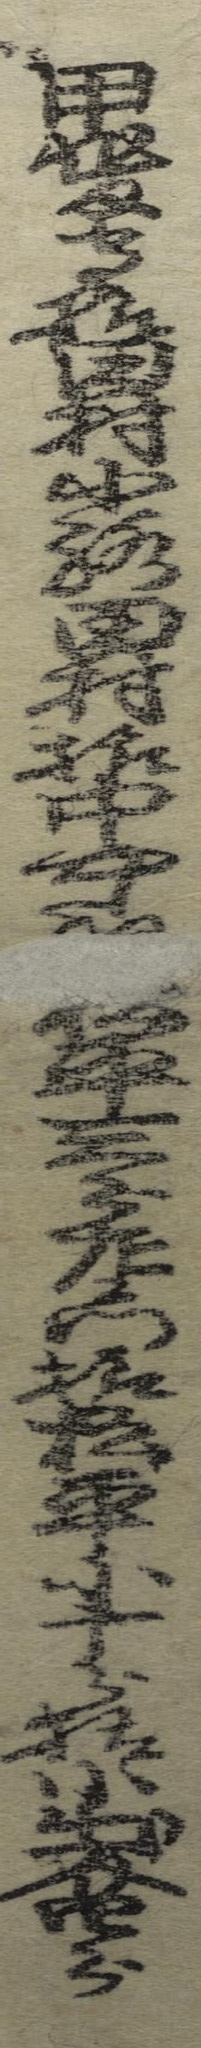甲斐守様田村小路田村様中やしき松平三郎左衛門様松平小十郎様小出介四郎
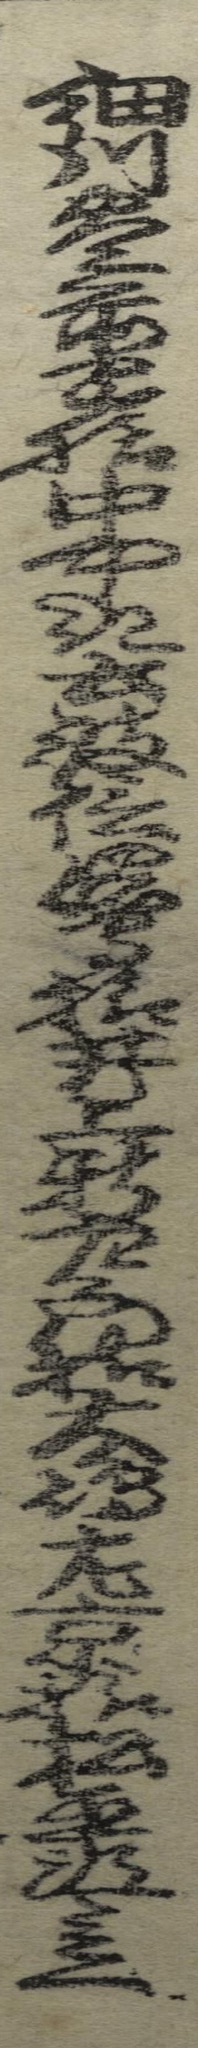細川豊前守様中やしき土岐信濃守様井上新左衛門様大嶋左京様松平次郎兵へ
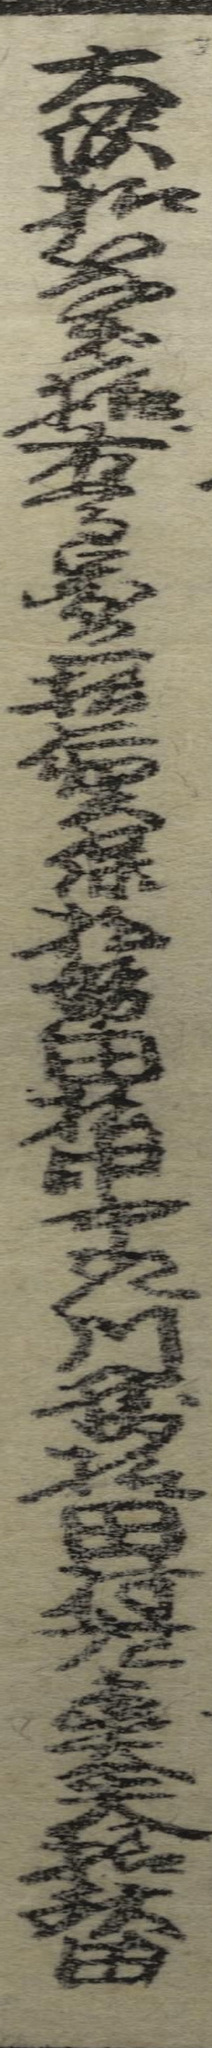大沢様いなば様有馬図書様仁賀保さま堀田様中やしき川勝様田村左京大夫様秋田
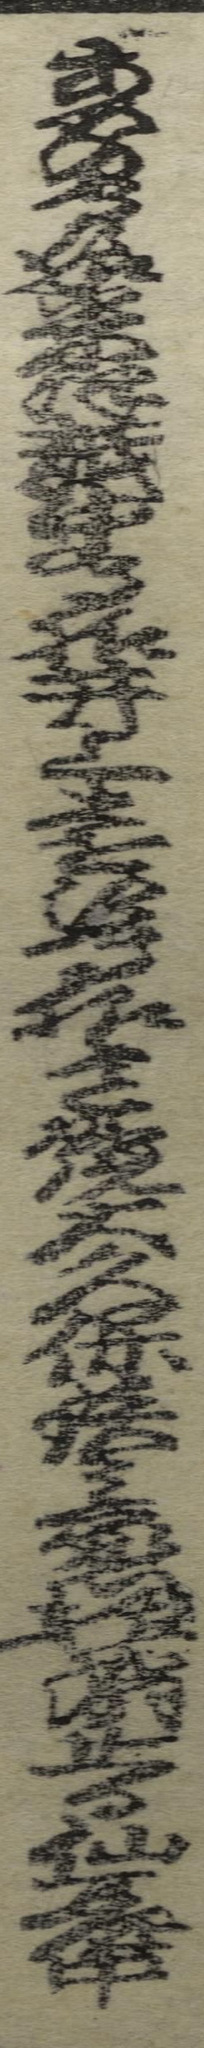あはの守様米津越中守様井上遠江守様迄焼大久保鉄之丞様止る仙台中
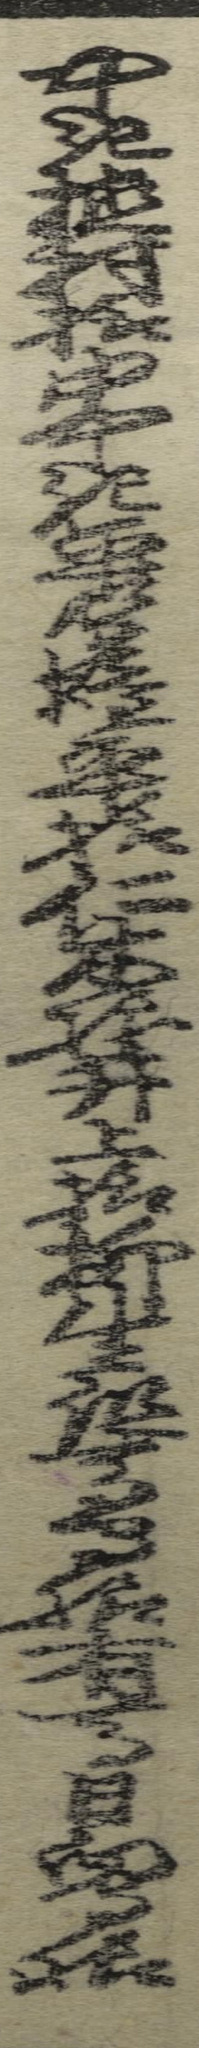やしき植村様中やしき平野権平様仁木様井上様柳生但馬守様有馬日向守様
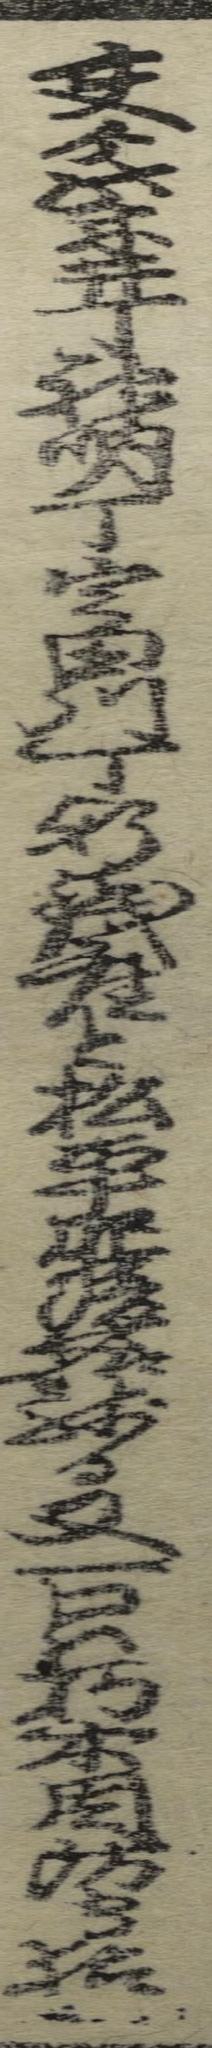夫ゟ柴井丁神明丁宇田川丁新銭座と松平肥後様残る又一口は朽木周防守様
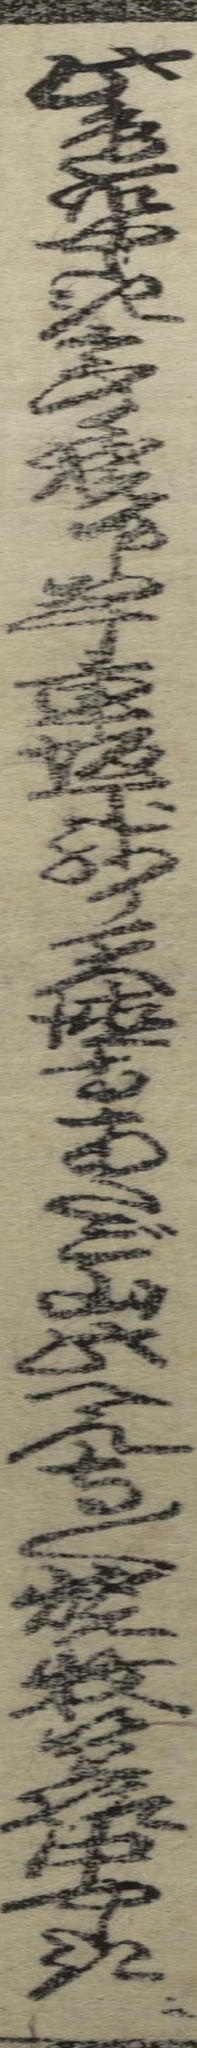此辺御やしき多く下や丁車坂丁残り天徳寺あたご山此へん寺々焼牧野様中やしき
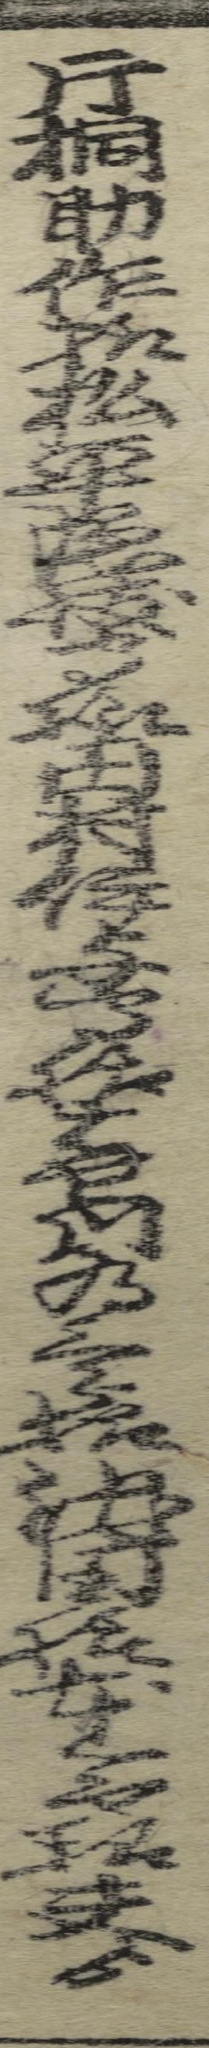片桐助作様松平隠岐守様田村伊与守様はや川為三郎様池田様本多や八様夫ゟ
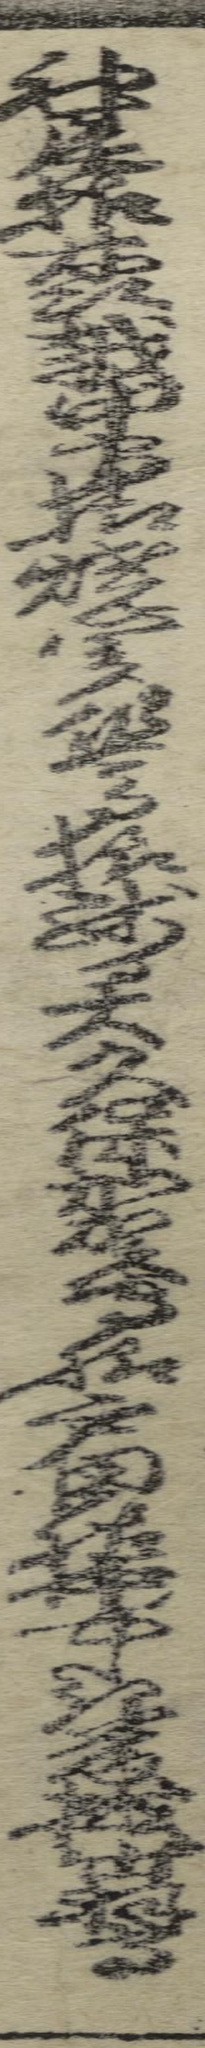神尾様森越中守様焼関但馬様残る大久保加賀守様戸田様中やしき藤掛出羽守
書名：[嘉永三年二月の江戸大火に関する瓦版]
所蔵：東京大学地震研究所図書室 Earthquake Research Institute Library, The University of Tokyo, JAPAN
